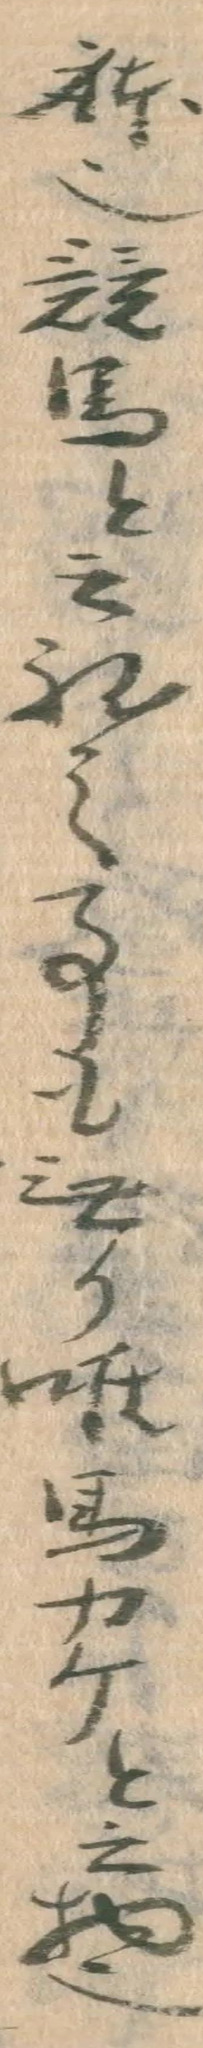躰也、競馬と云程之事も無候、唯馬力ケと云物也、
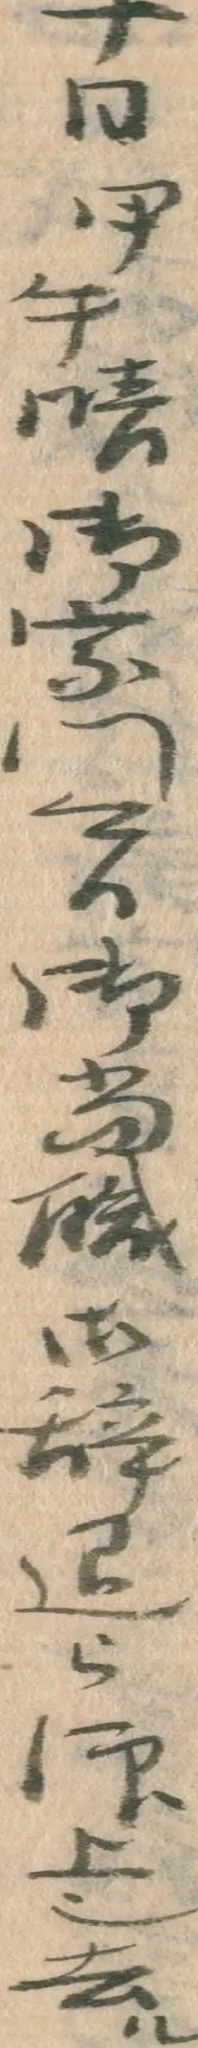十日甲午晴、御家門今日御當職御辞退被仰上也、去ル
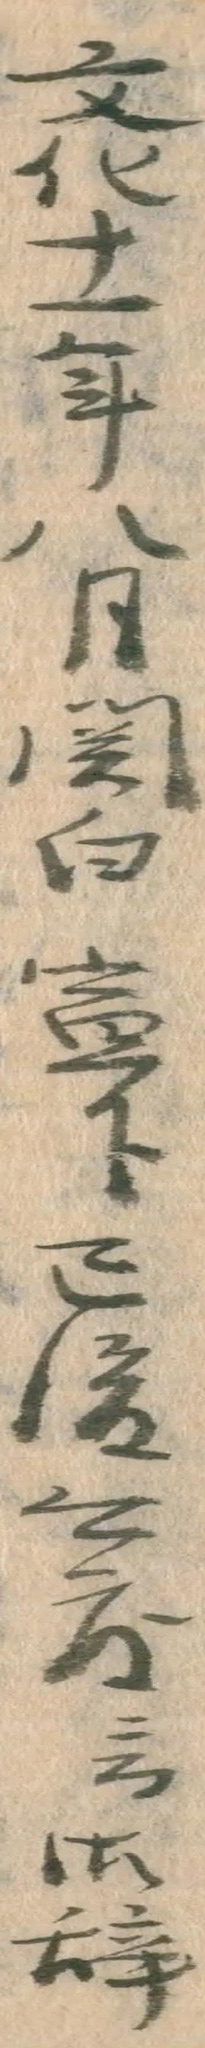文化十一年八月関白宣下已後、今度ニ而御辞
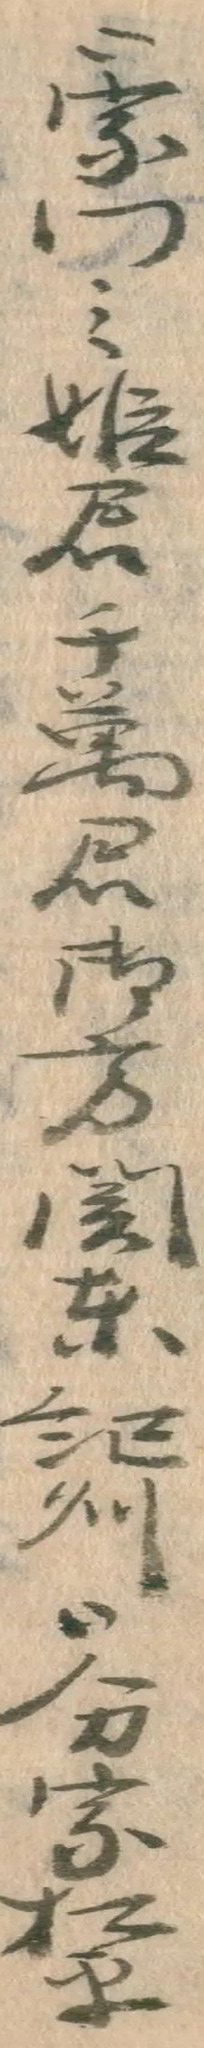御家門之姫君千萬君御方、関東紀州御分家松平
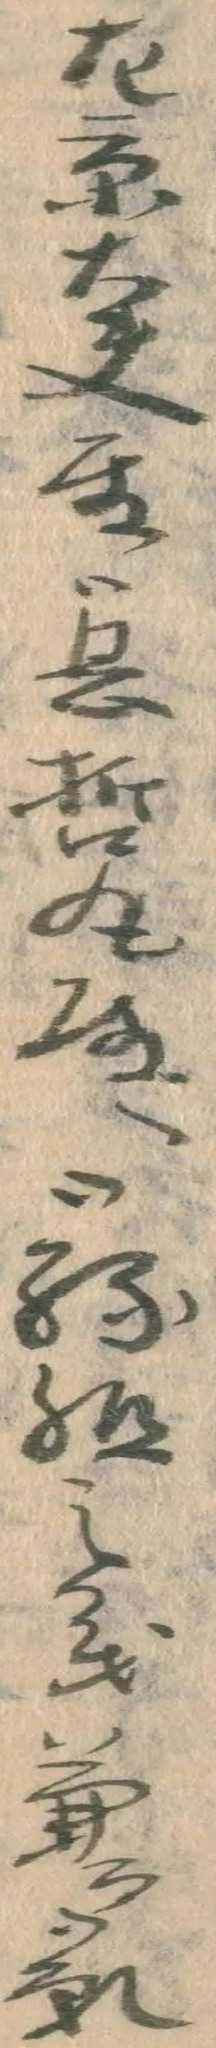左京大夫殿御息哲丸殿へ御縁組之義、兼而御願
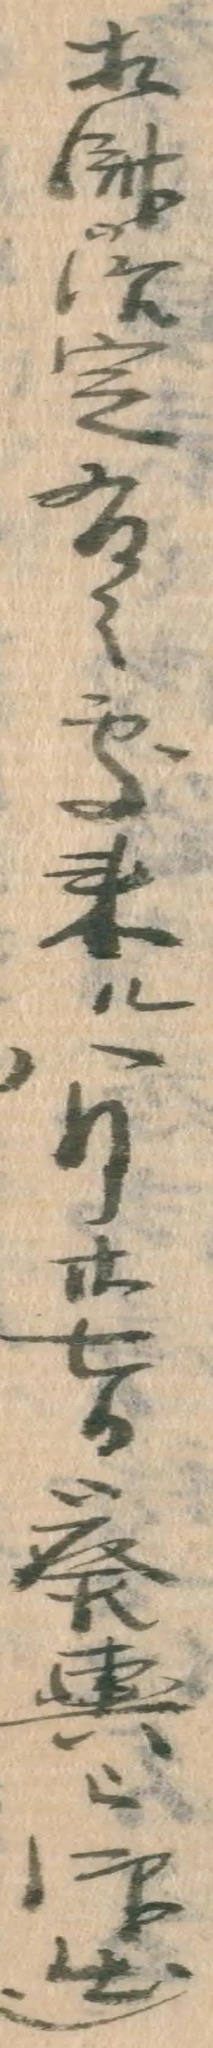相済、治定有之處、来ル八月廿七日御発輿被仰出、
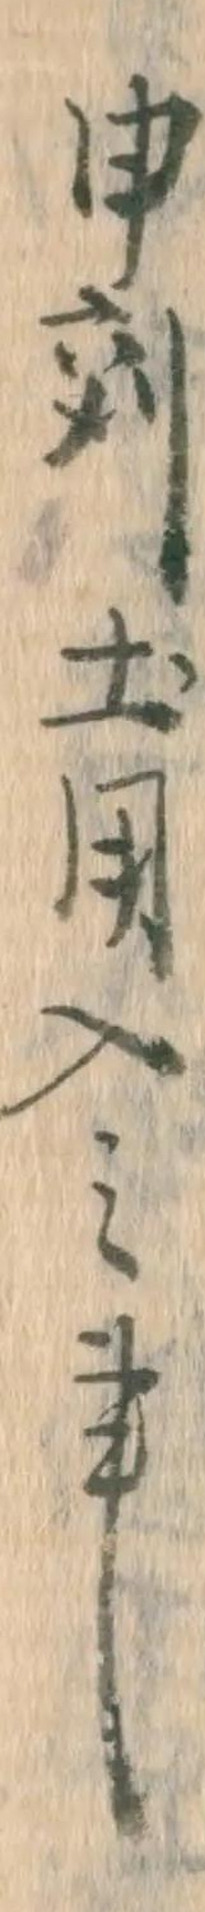申刻土用入之事、
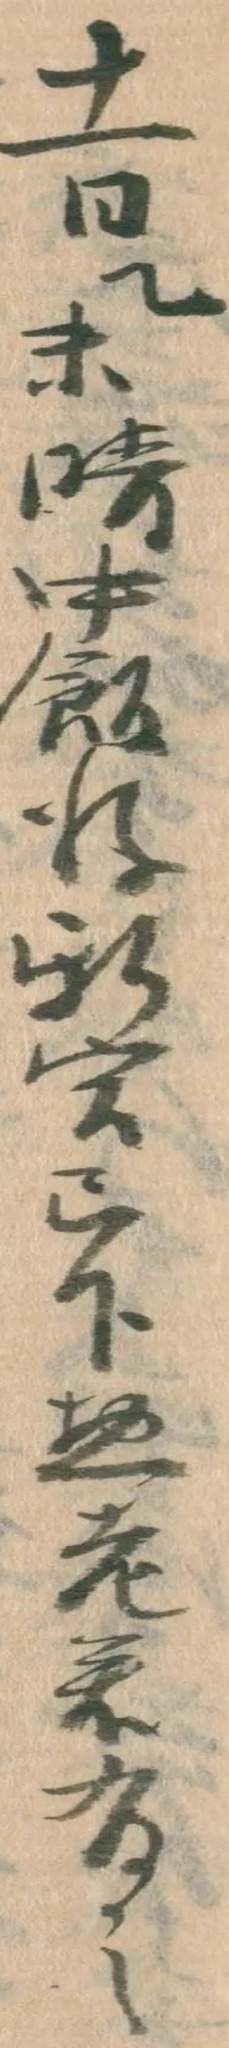十一日乙未晴、中飯後、新宮已下惣老若有之、
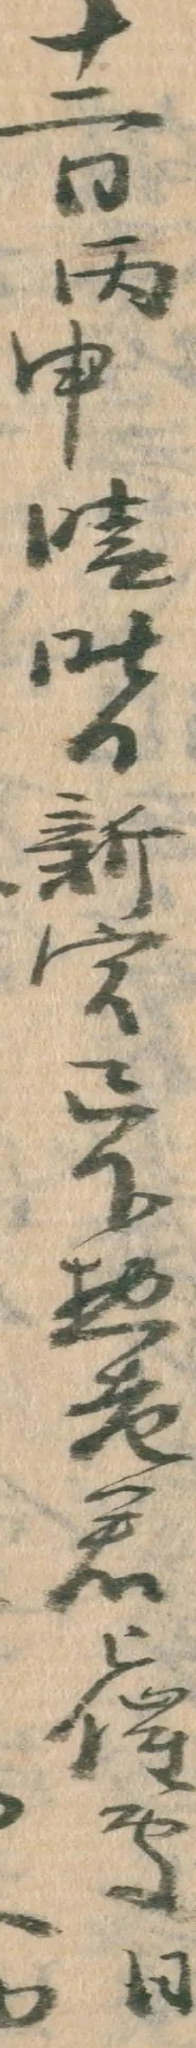十二日丙申晴、昨日新宮已下惣老若被催處、日
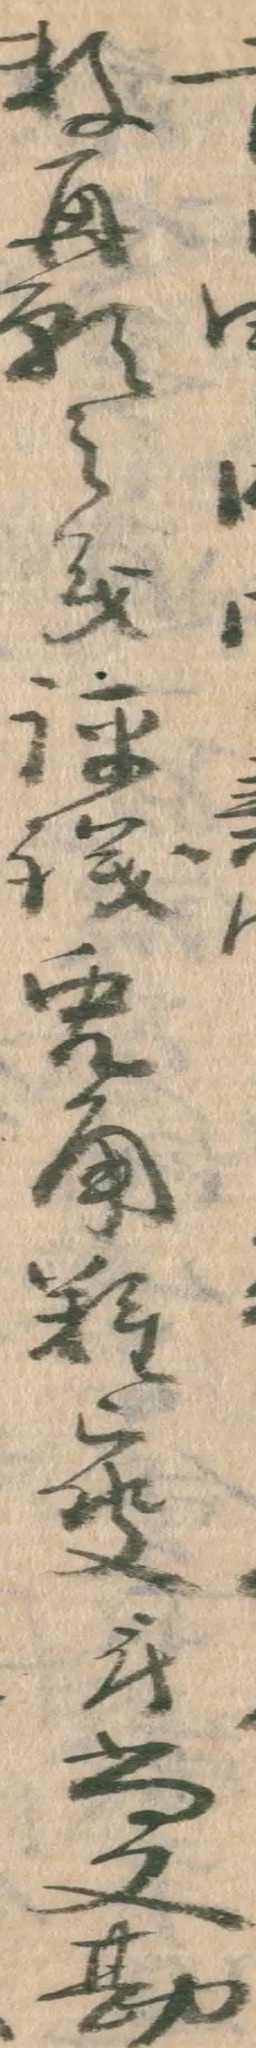数再願之義評議、兎角難被決ニ付、尚又勘
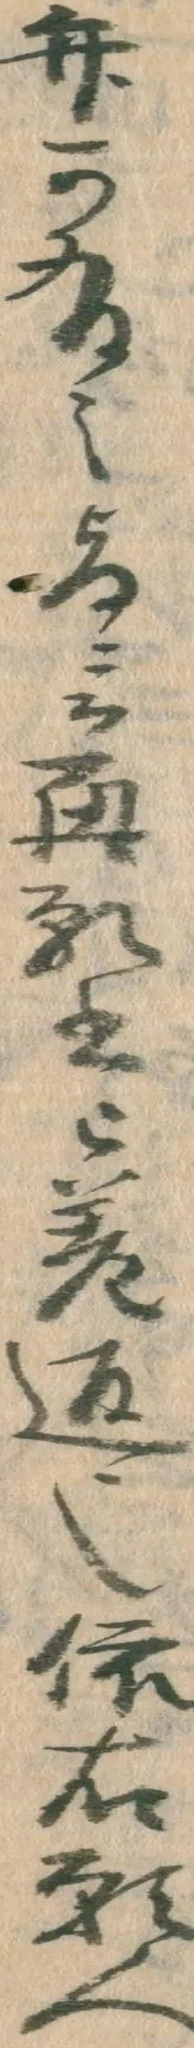弁可有之旨ニ而、再願書被差返也、依右願人
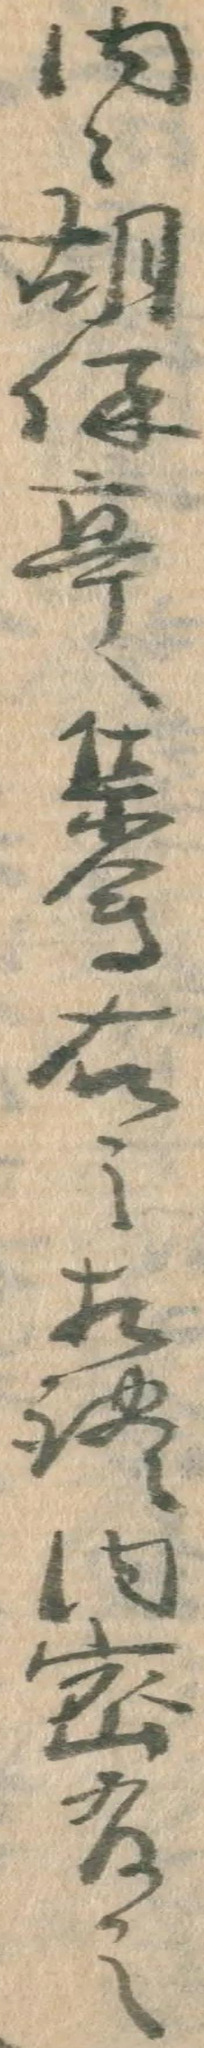内々胡保亭へ集會、右之相談内密有之、
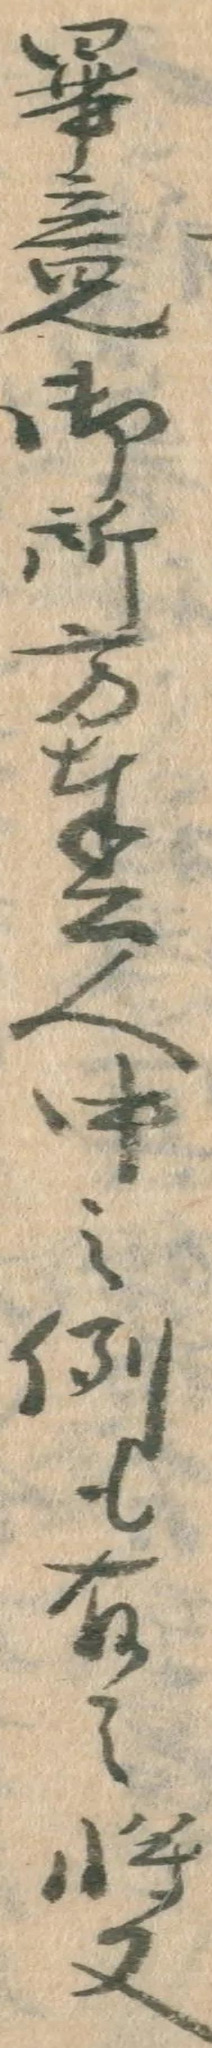畢竟御所方奉公人中之例も有之、将又
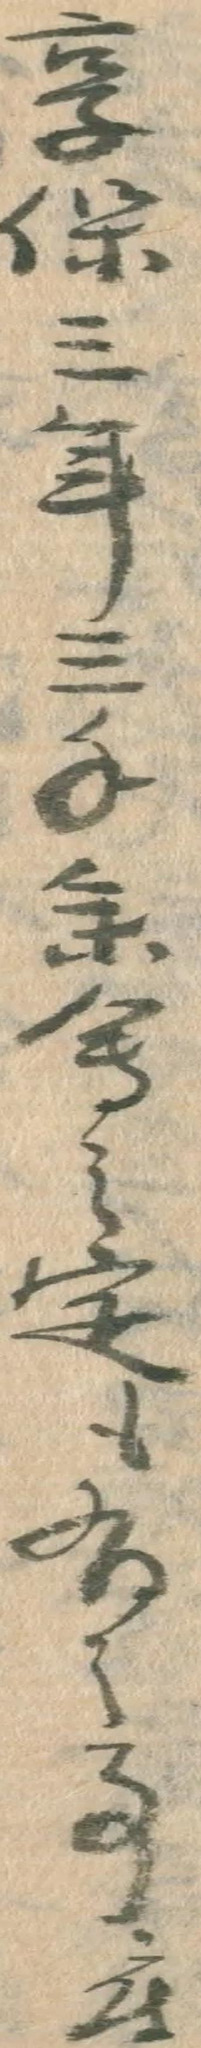享保三年三手参會之定も有之事ニ付、
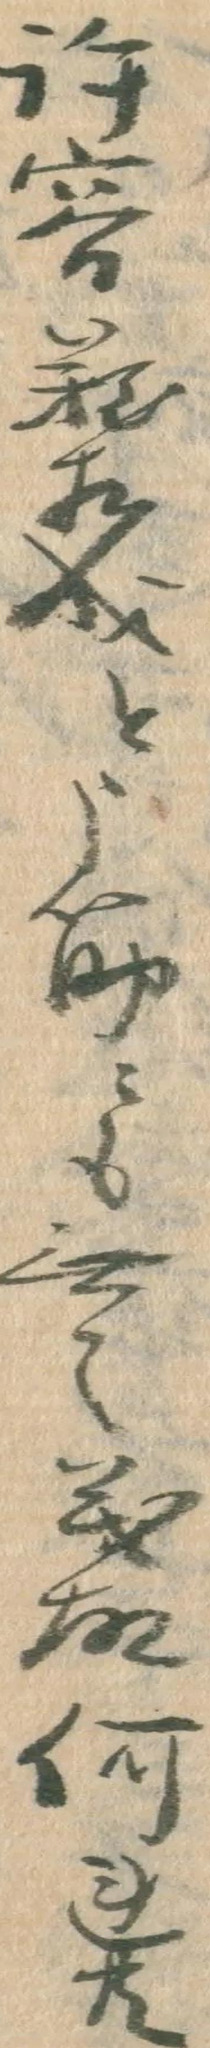許容御難相成と申筋ニも無之義故、何れ共
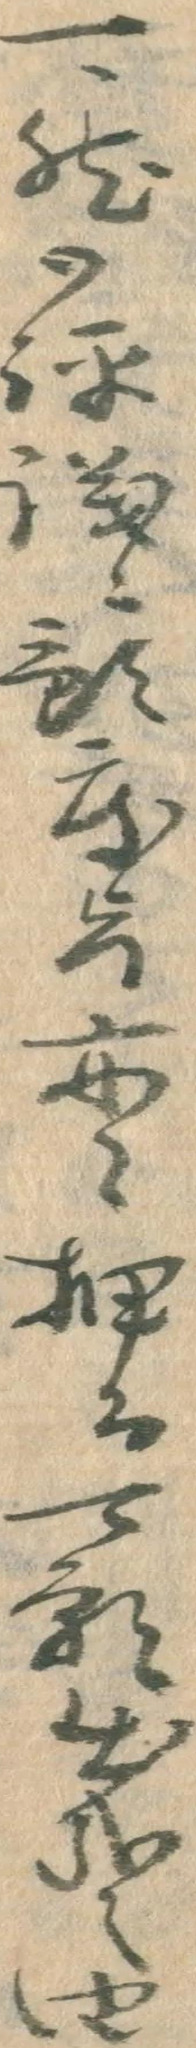可然御評議ニ預度旨、亦々押而可願出哉之由
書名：賀茂社記録. 第63冊
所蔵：国立国会図書館 National Diet Library, JAPAN
